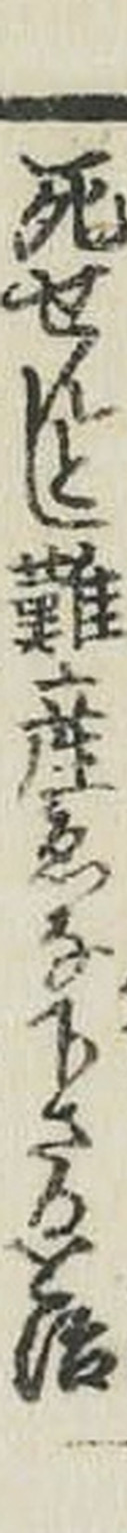死せんとし難産ゑな下さるを治
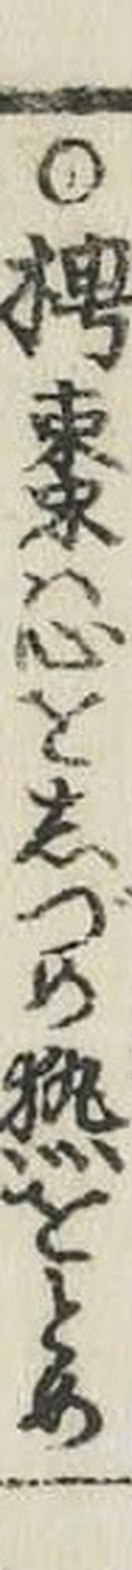○梬棗は心をしづめ熱をとめ
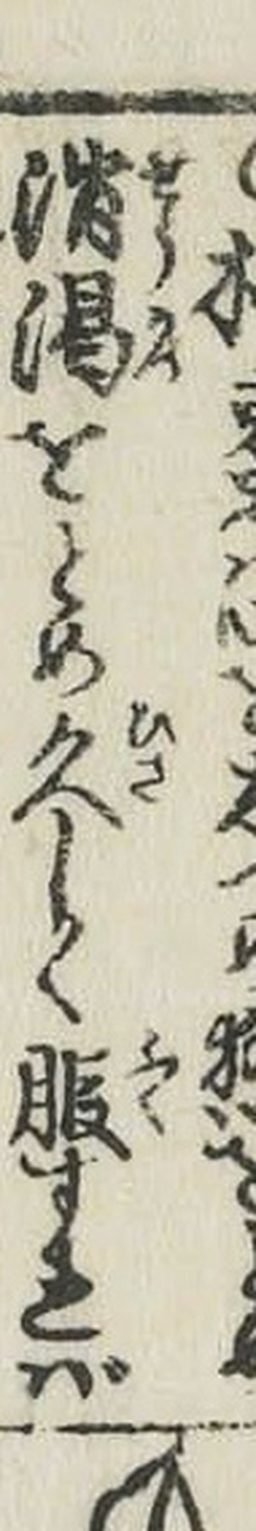消乾をとめ久しく服すれば
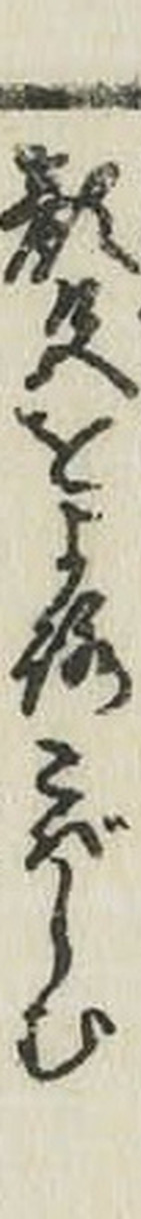顔色をよろこばしむ
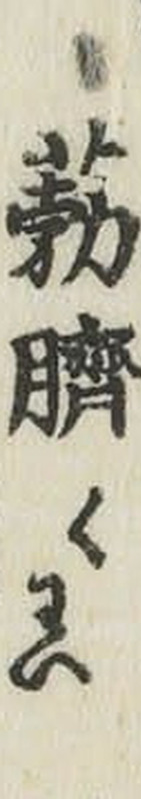葧臍くわい
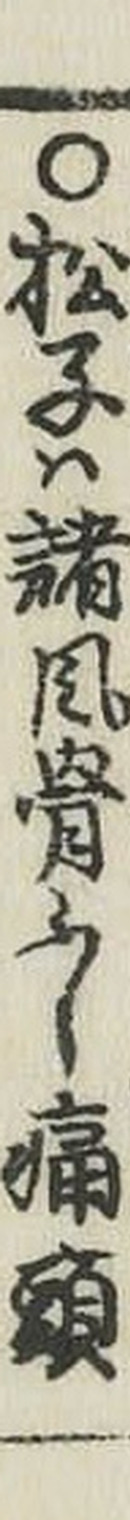○松子は諸風骨ふし痛頭
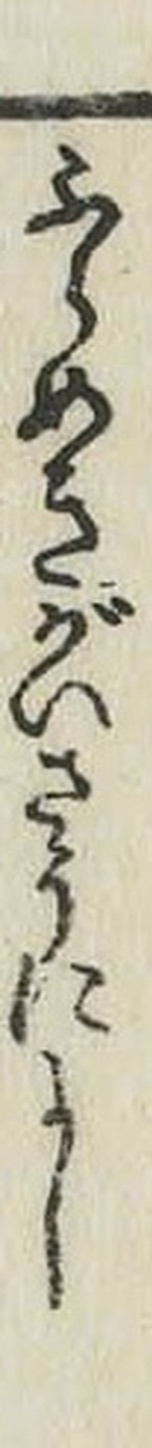ふらめきがいさうによし
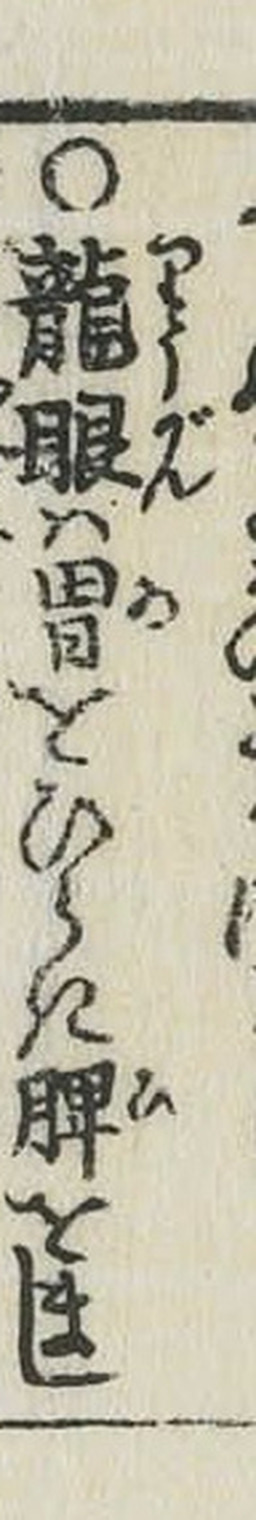○龍眼は胃をひらき脾をまし
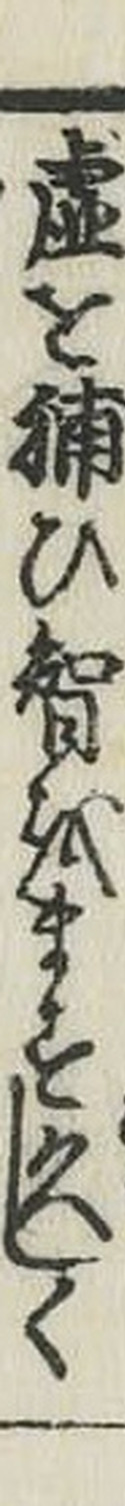虚を補ひ智をます久しく
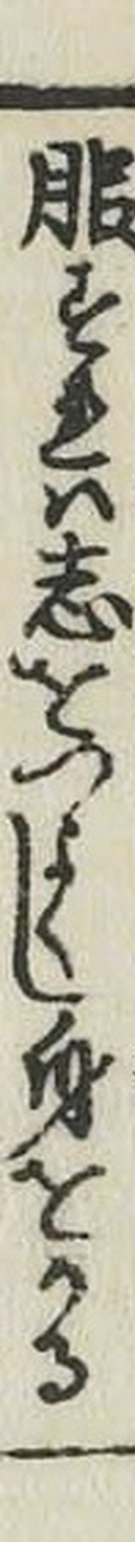服すれは志をつよくし身をかる
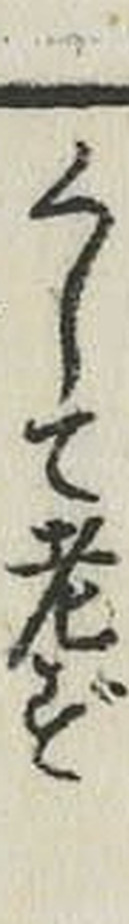くして老ず
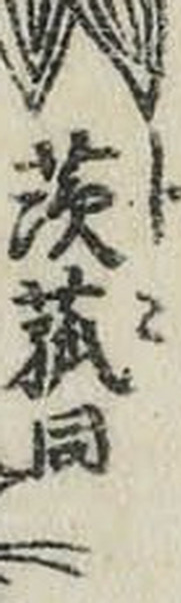茨菰同
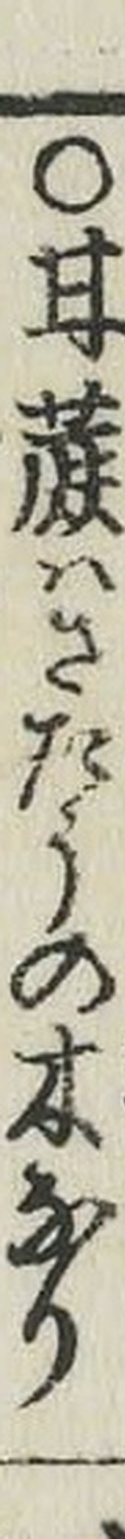○甘蔗はさたうの木なり
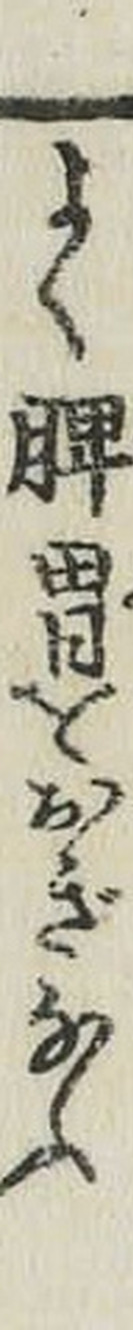よく脾胃をおぎなふ
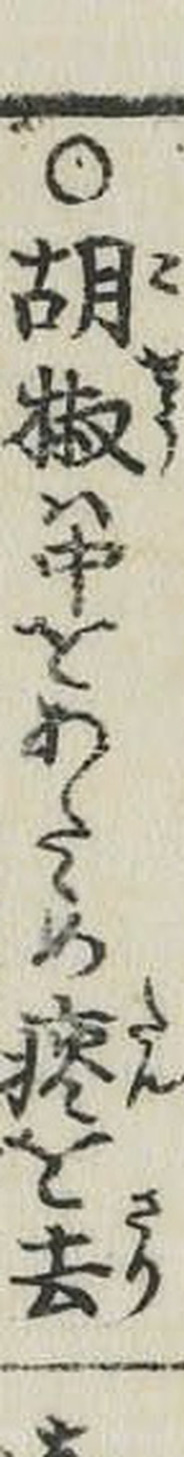○胡椒は中をあたゝめ痰を去
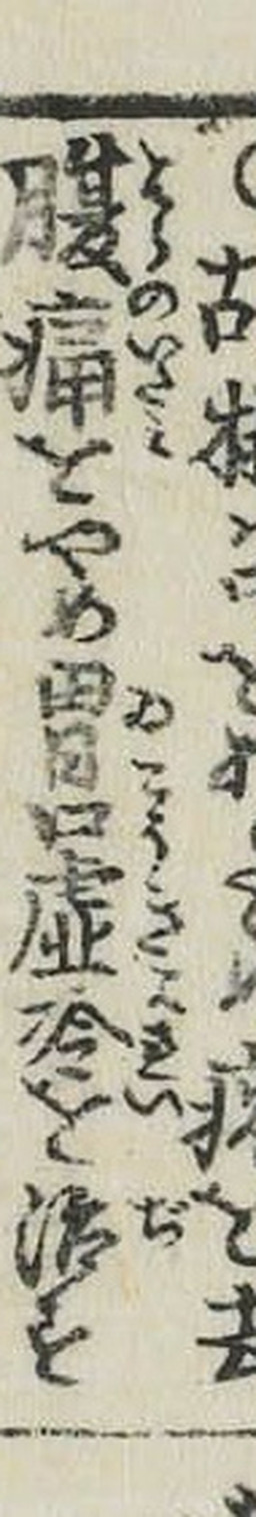腹痛をやめ胃口虚冷を治す
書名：増補頭書訓蒙図彙大成 10巻 8:巻之17-19
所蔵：東京学芸大学教育コンテンツアーカイブ
